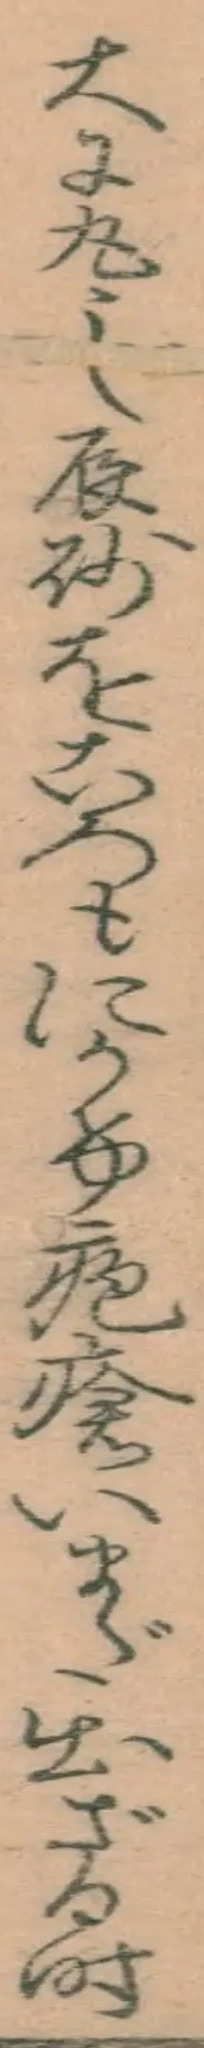大に丸し辰砂をころもにかけ疱瘡いまだ出ざる時
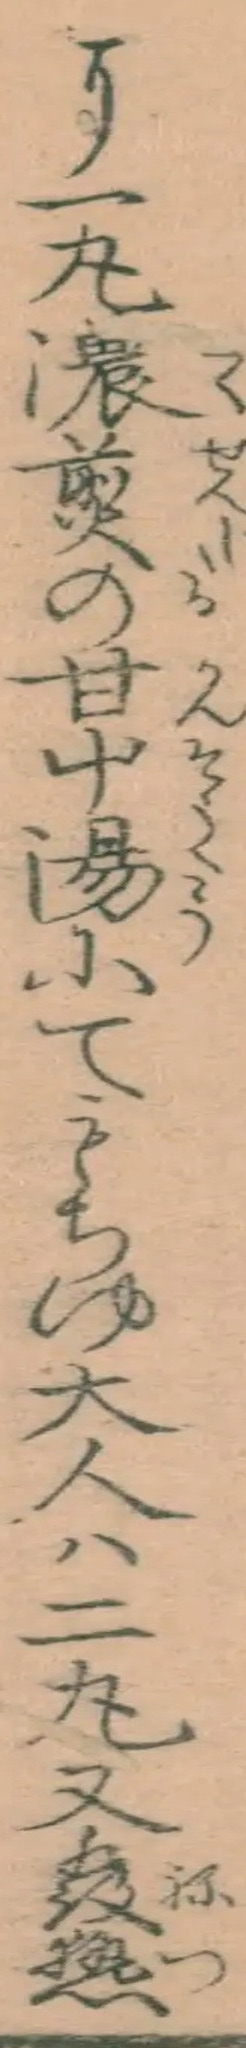に一丸濃煎の甘屮湯にてもちゆ大人は二丸又発熱
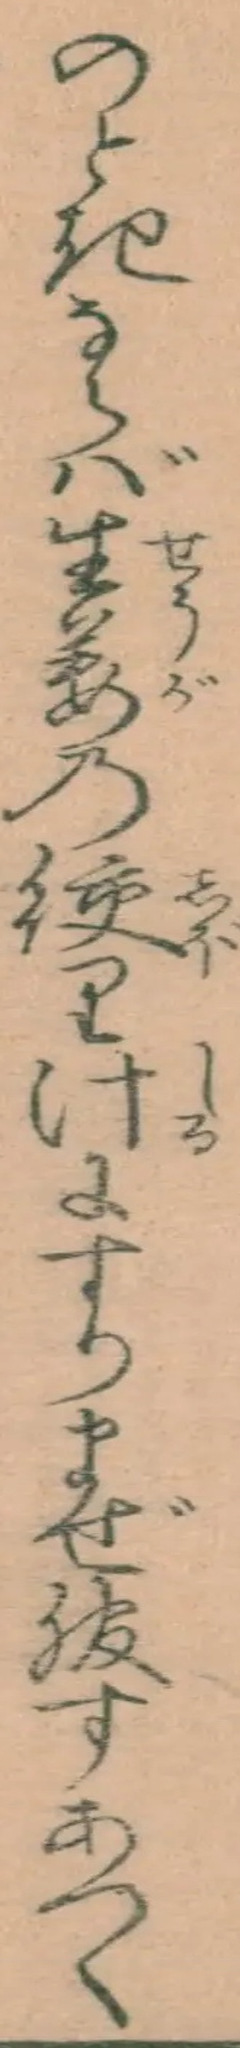のときならば生姜の絞り汁にすりまぜ服すあつく
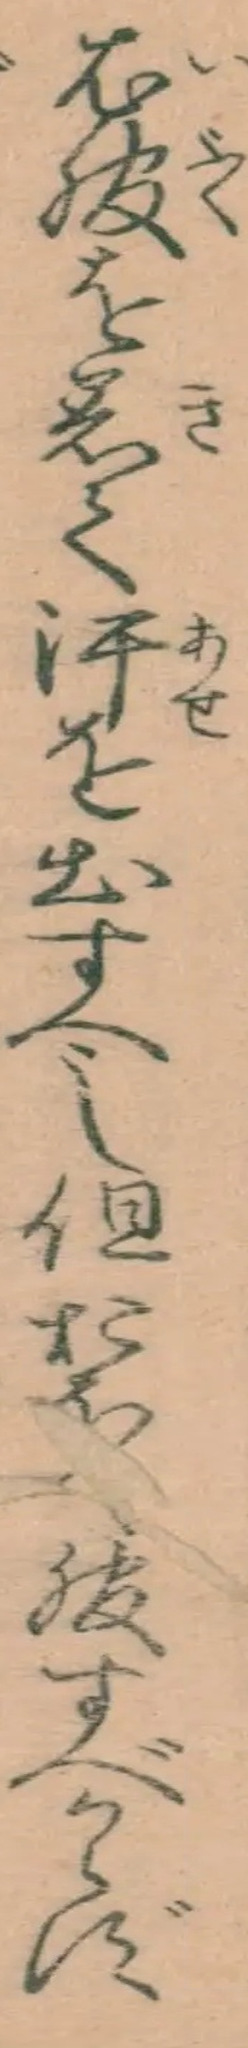衣服を着て汗を出すへし但おほ▢服すべからず
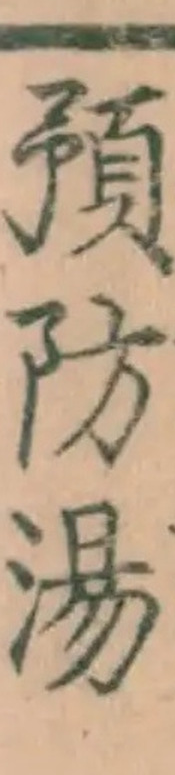預防湯
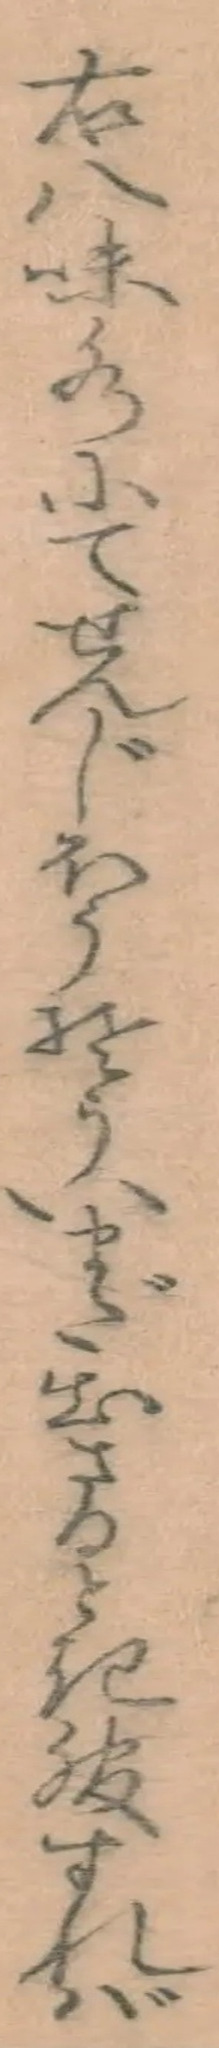右八味水にてせんじほうそういまだ出さるとき服すれば
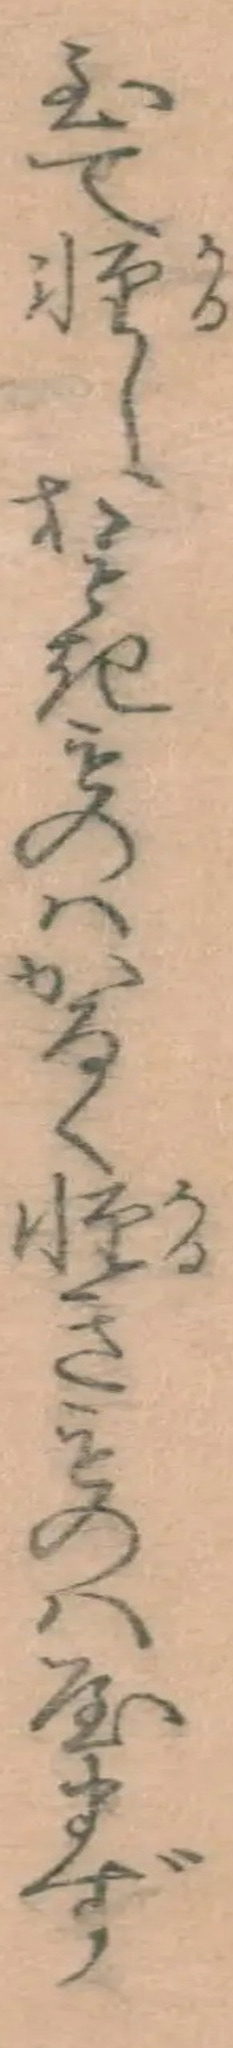至て軽しおもきものはかるく軽きものはやまず
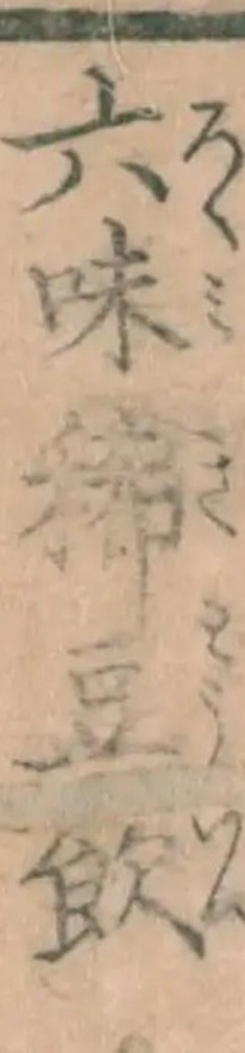六味稀豆飲
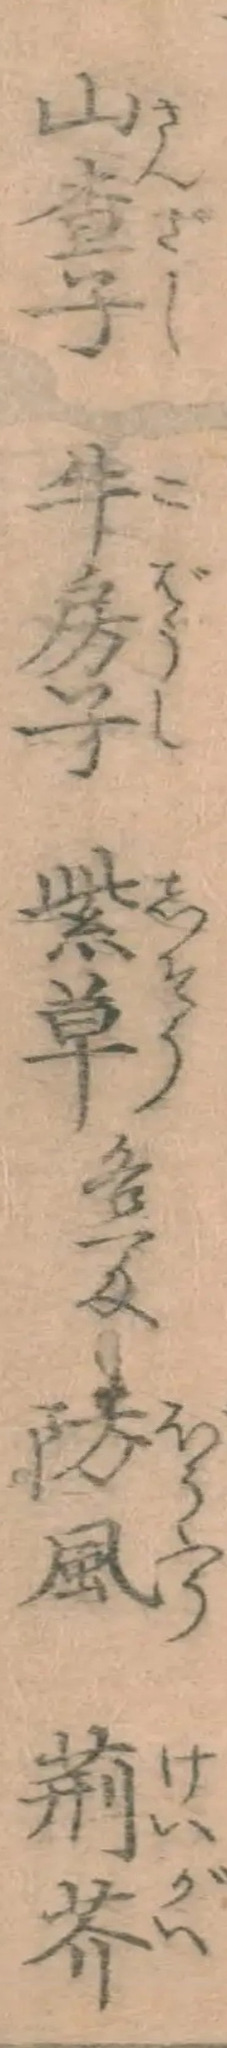山査子牛房子紫草各一匁防風荊芥

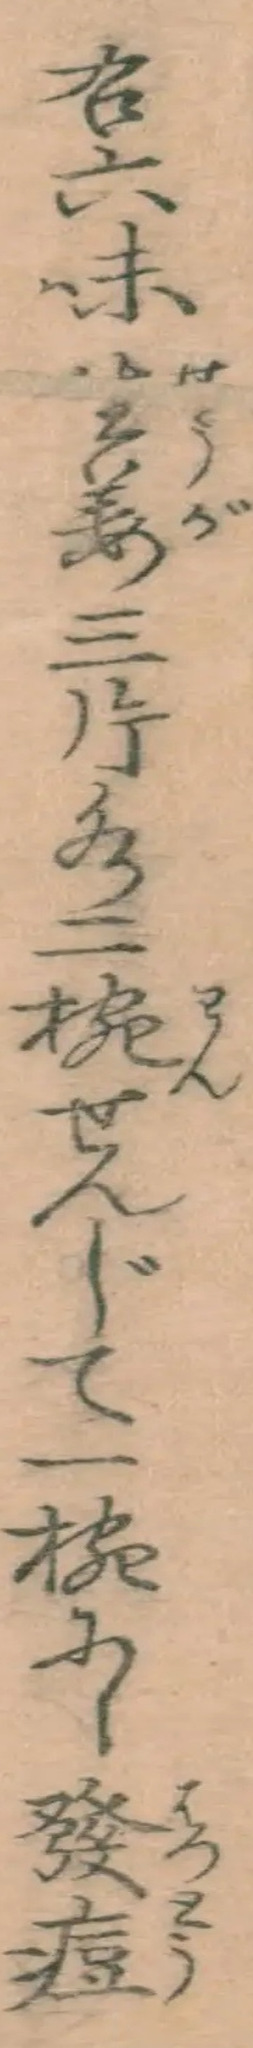右六味生姜三片水二椀せんじて一椀にし発痘
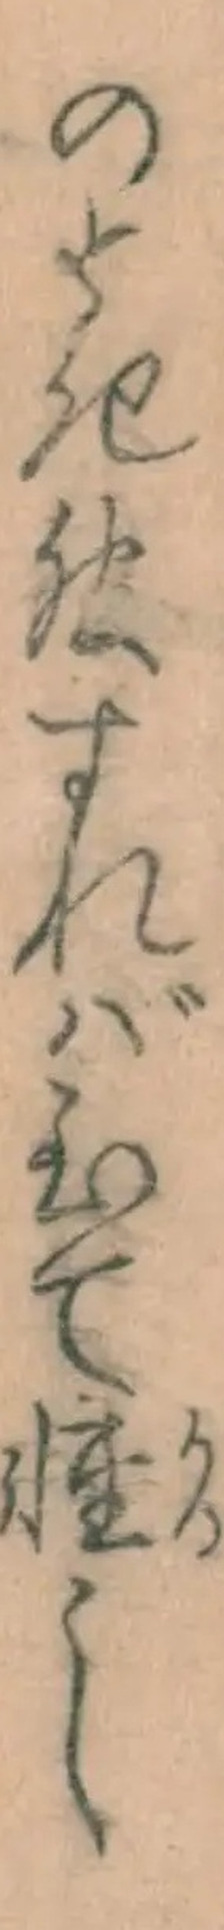のとき服すれば至て軽し
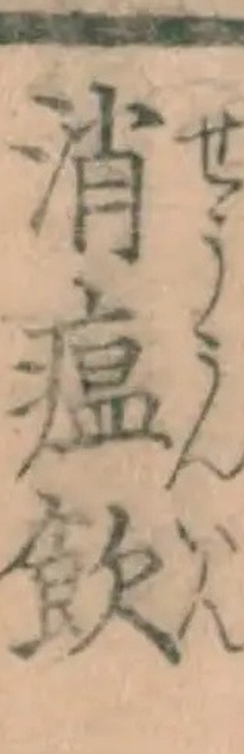消瘟飲
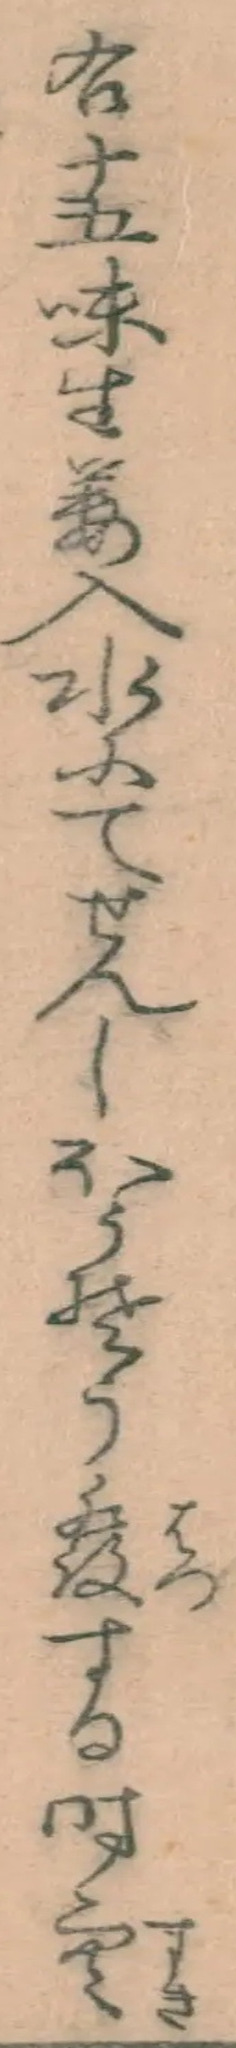各十五味生姜入水にてせんしほうそう発する時空
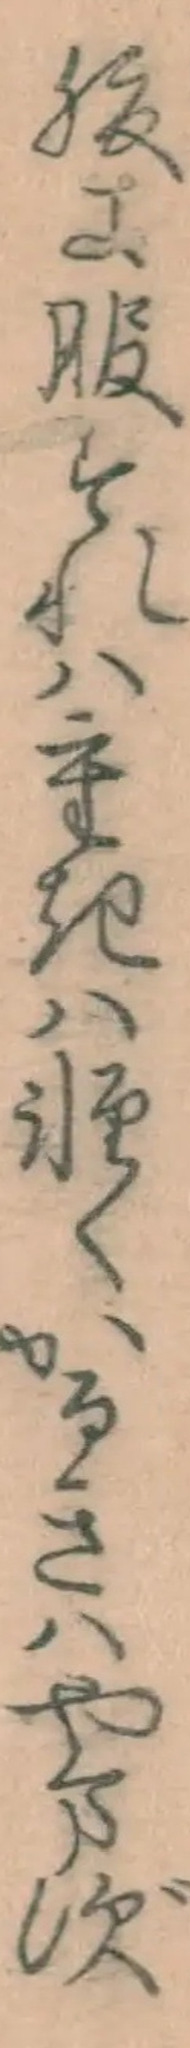腹に服すれは重きは軽くかるきはやまず
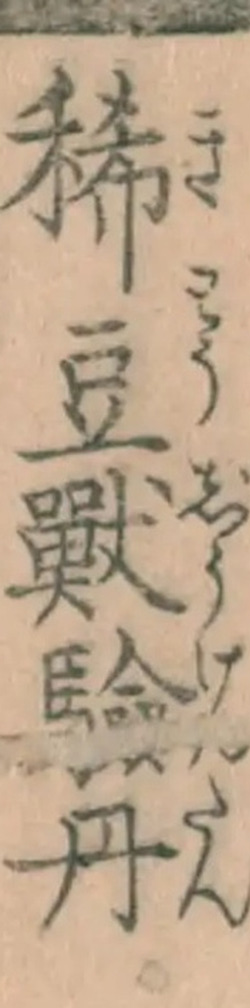稀豆獣験丹
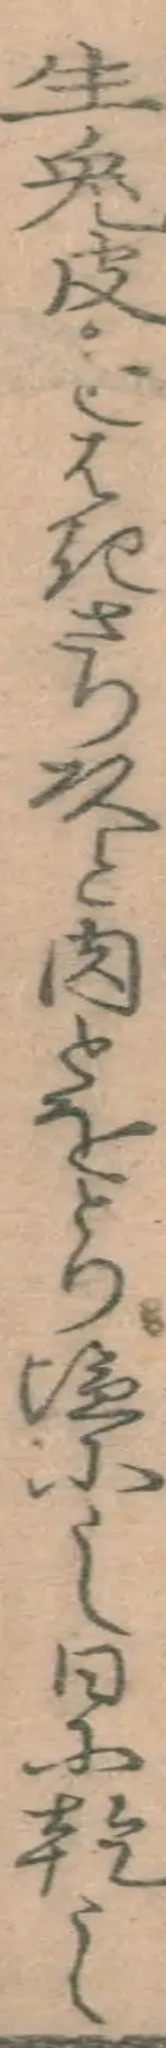生兎皮をはぎさり頭と肉とをとり塩にし日に乾し
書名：雨夜談
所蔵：国立国会図書館 National Diet Library, JAPAN
